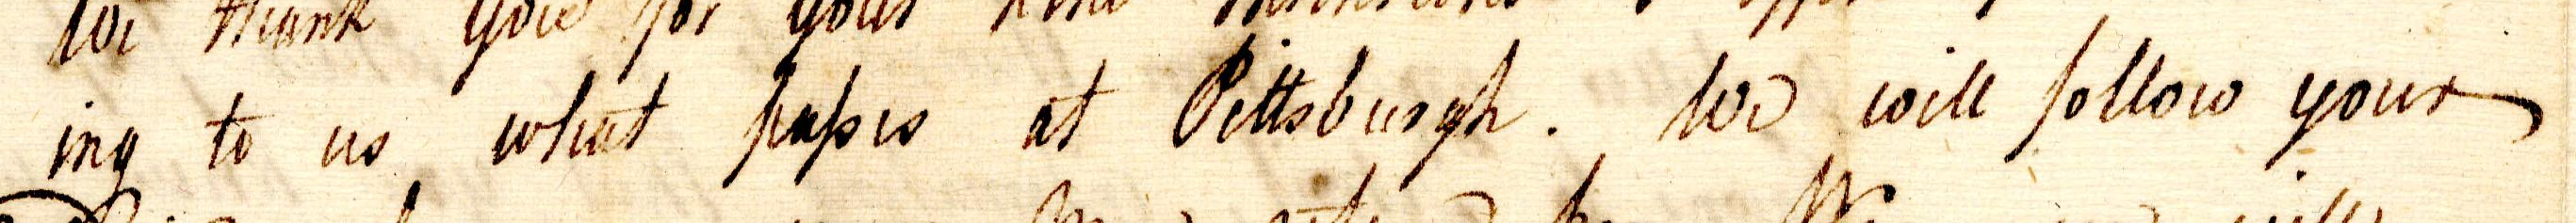ing to us what passes at Pittsburgh. We will follow your
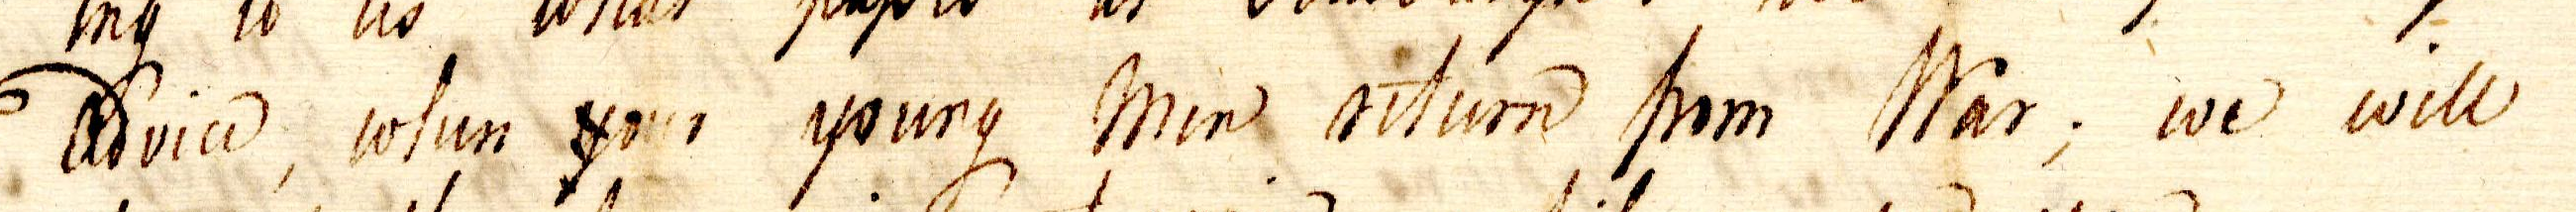Advice, when your young Men return from War; we will
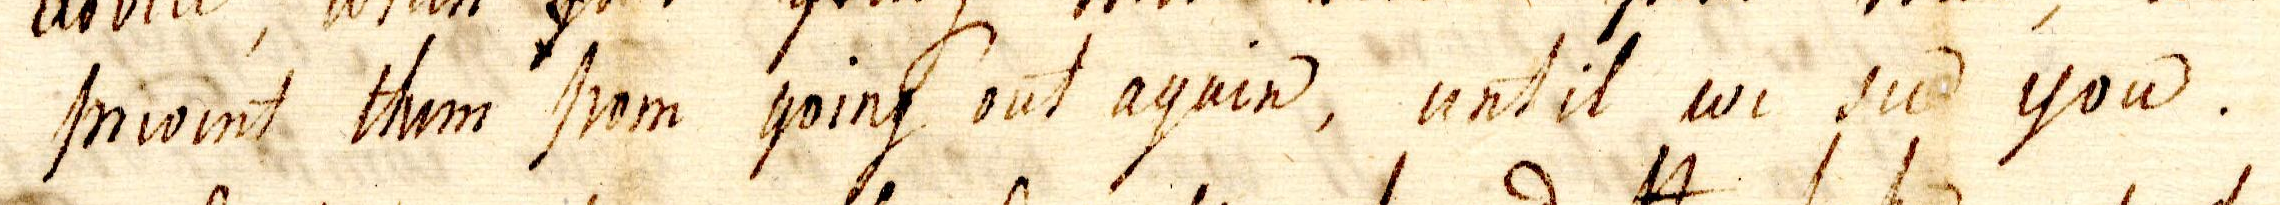prevent them from going out again, until we see you.
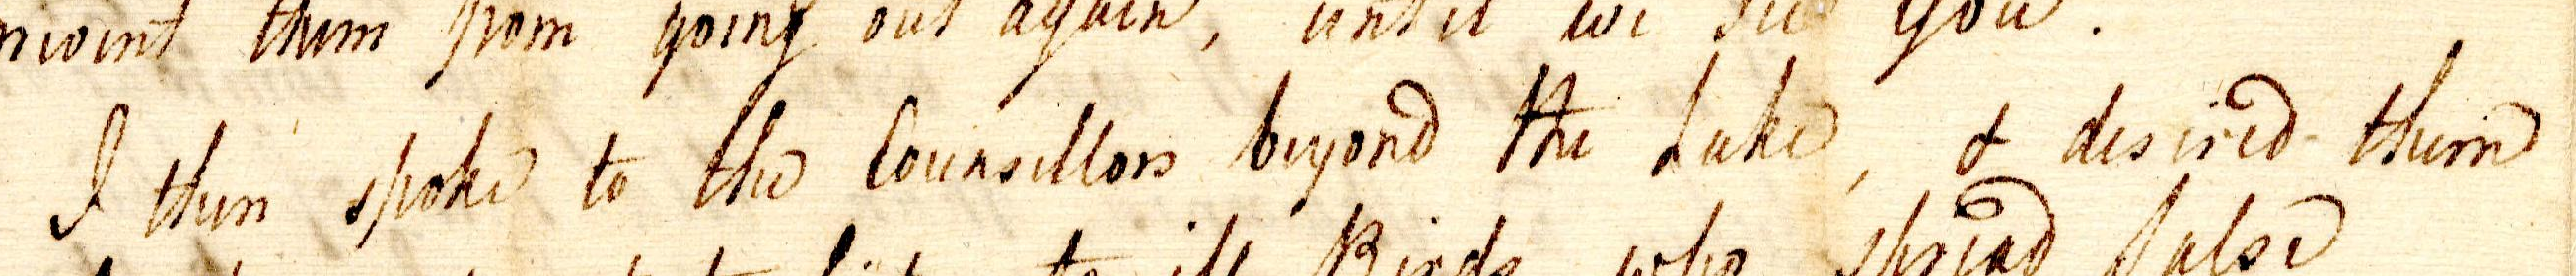I then spoke to the Counsellors beyond the Lake, & desired them
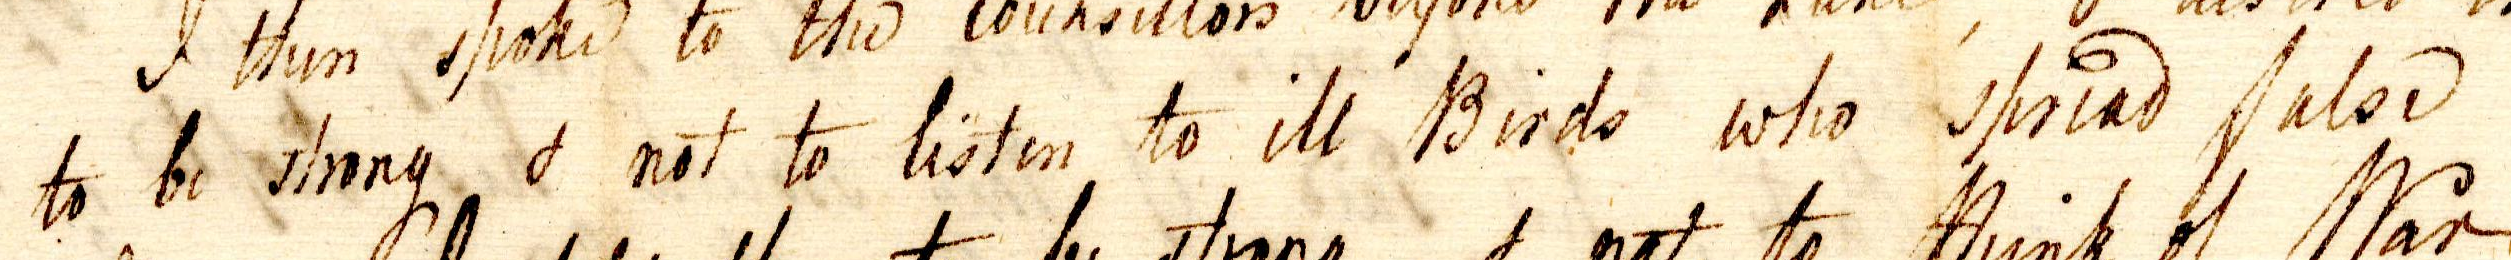to be strong & not to listen to ill Birds who spread false
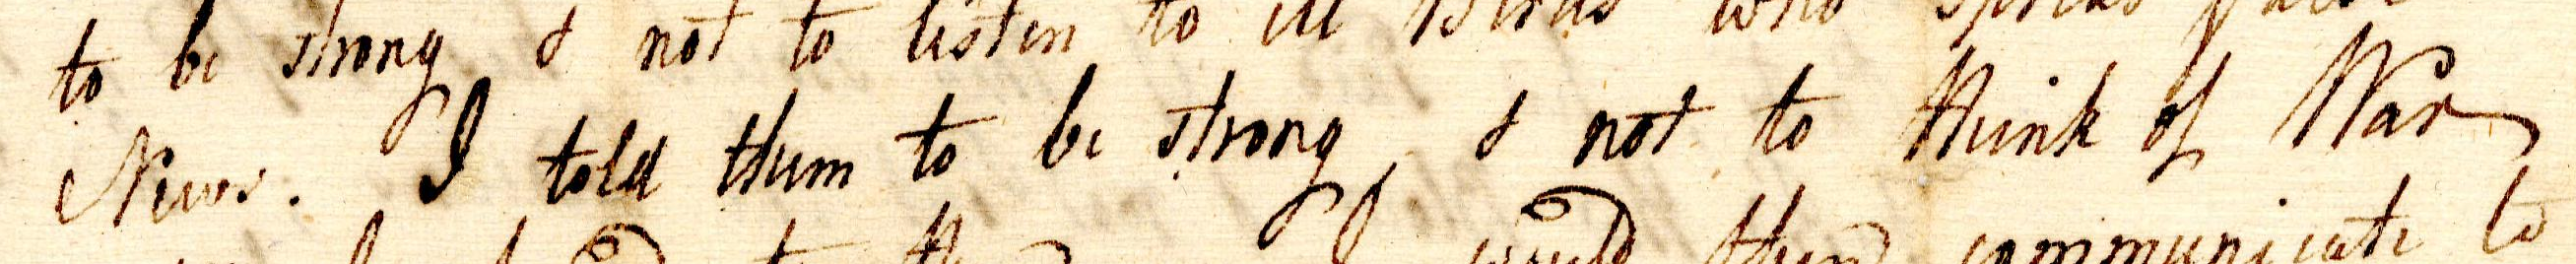News. I told them to be strong, & not to think of War
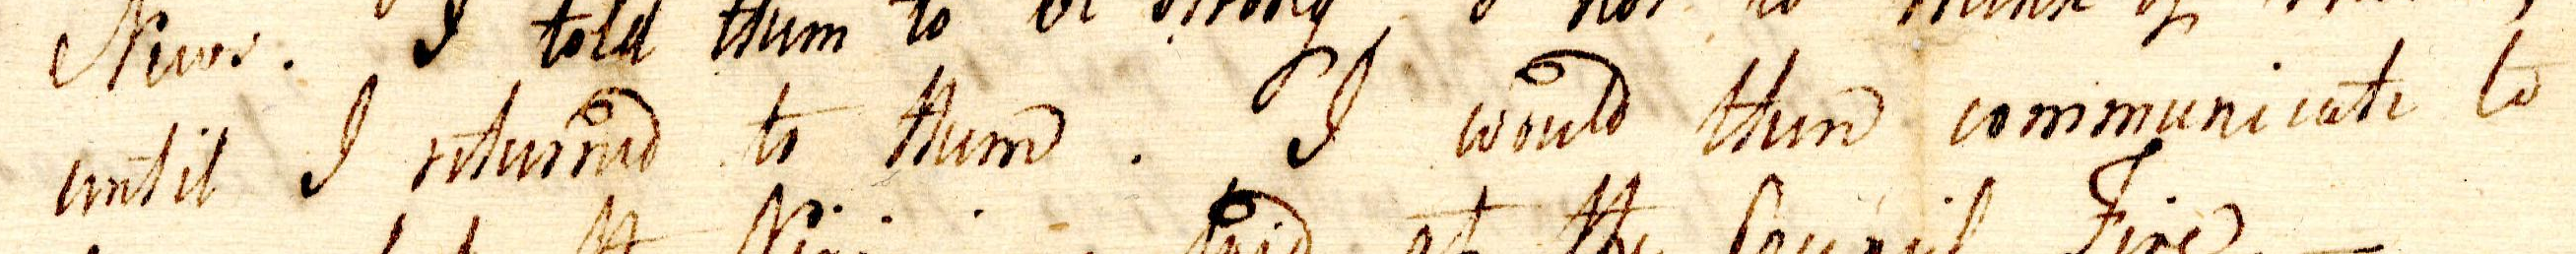until I returned to them. I would then communicate to
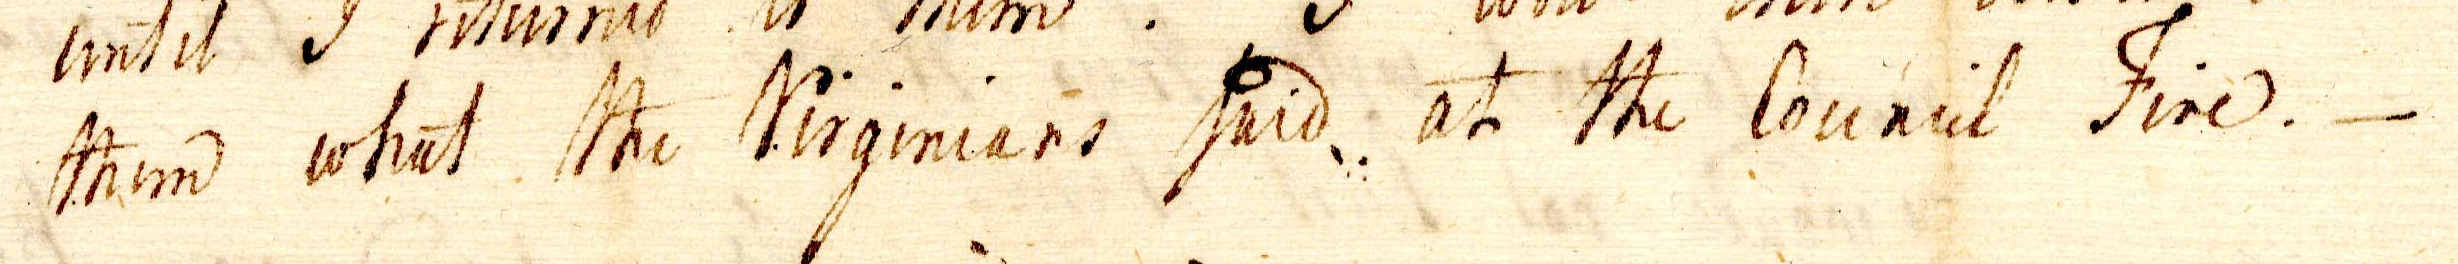them what the Virginians said, at the Council Fire.-
